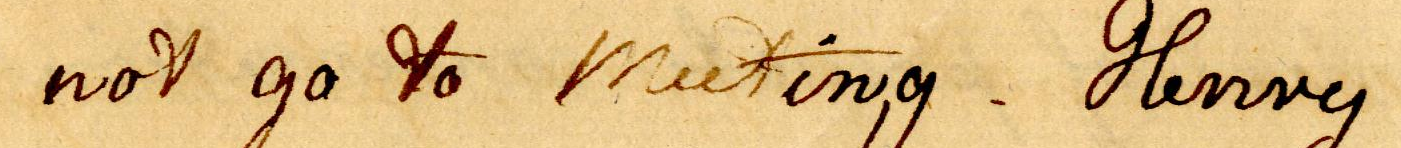not go to Meeting- Henry
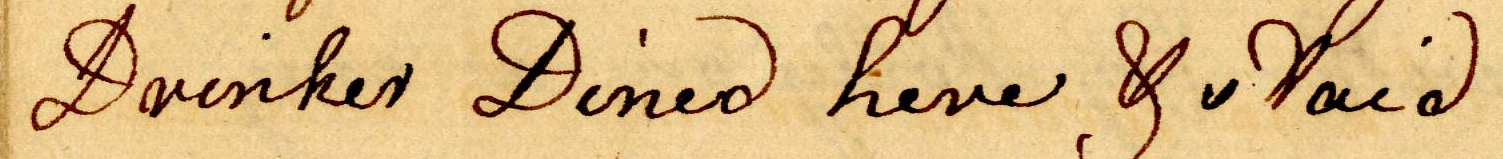Drinker Dined here & staid
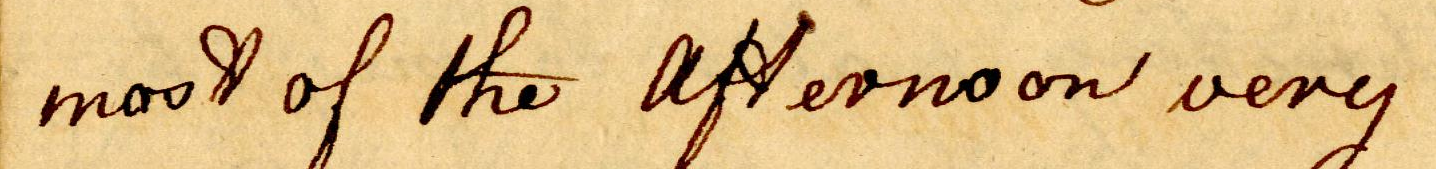most of the Afternoon very
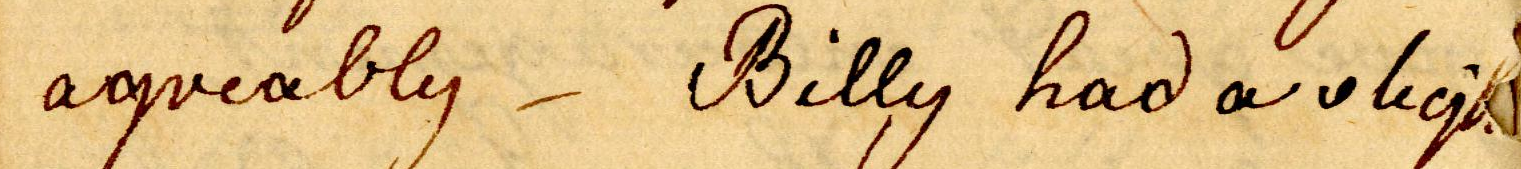agreably- Billy had a slig
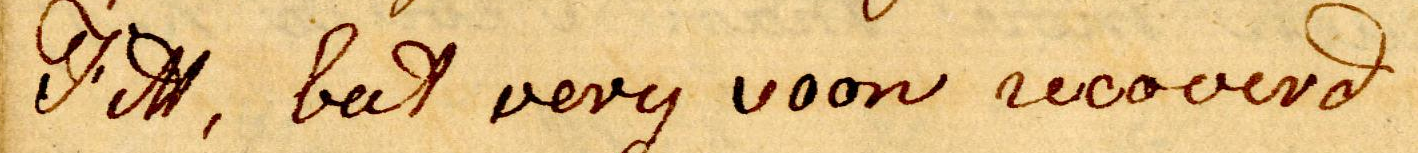Fitt, but very soon recoverd
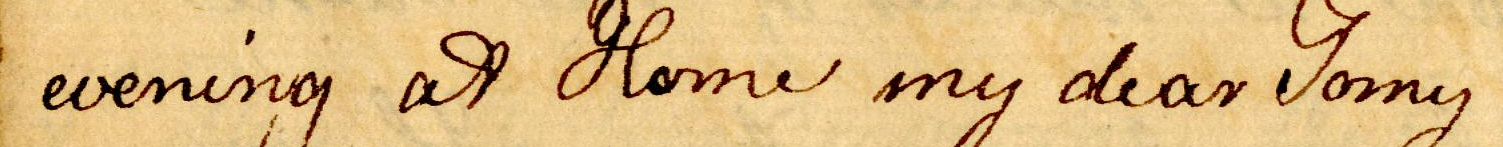evening at Home my dear Tomy
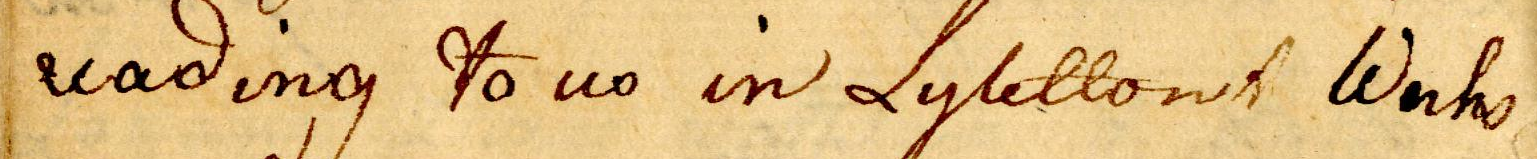reading to us in Lytellon Works
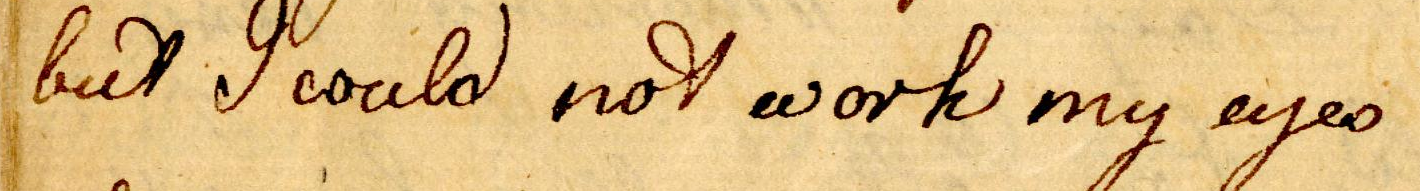but I could not work my eyes
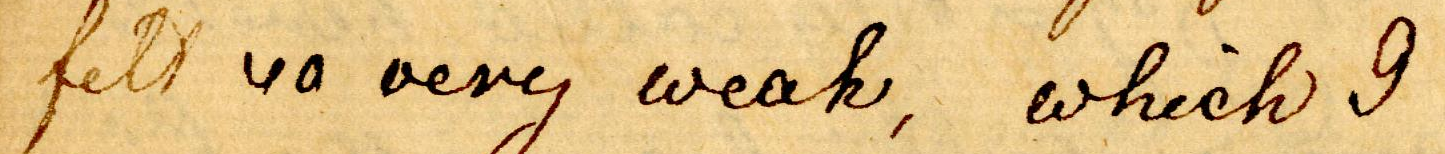felt so very weak, which I
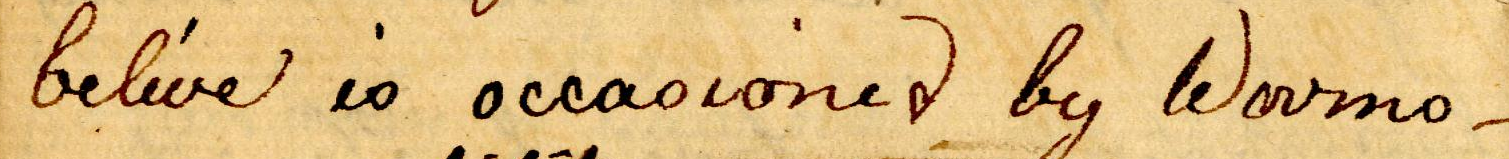belive is occasioned by Worms
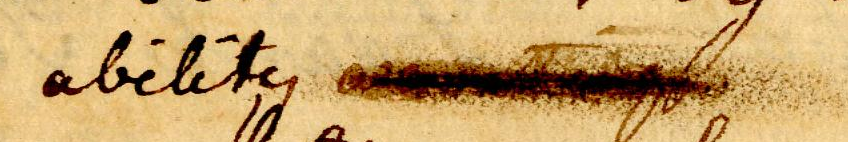ability [________]
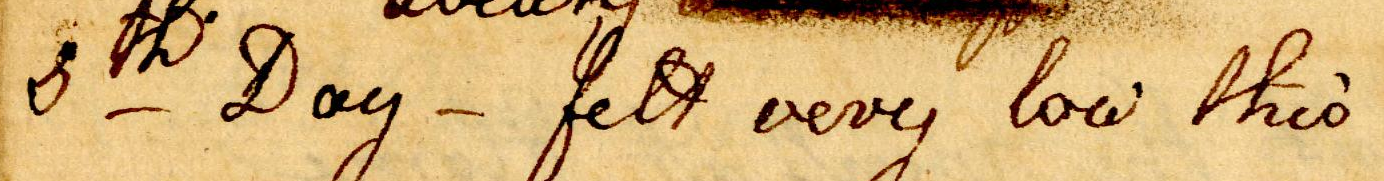5^th Day- felt very low this
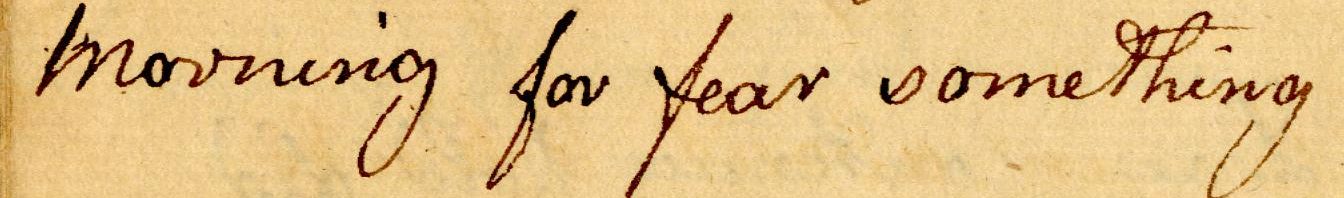Morning for fear something
